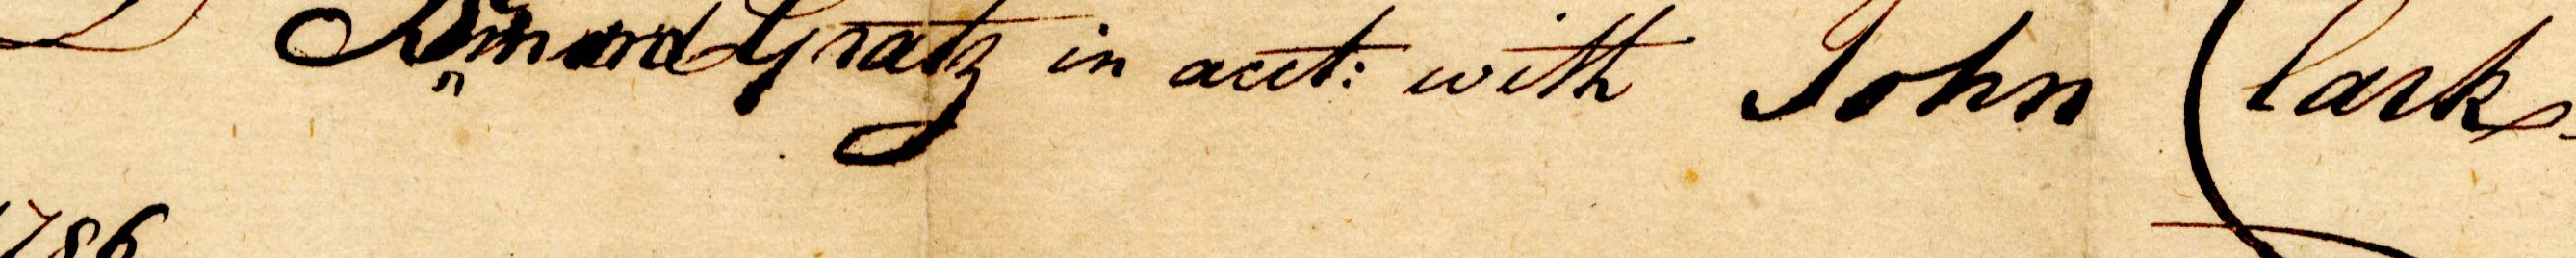D^r Barnard Gratz in acc^t: with John Clark
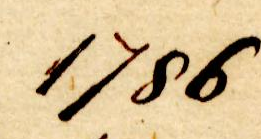1786
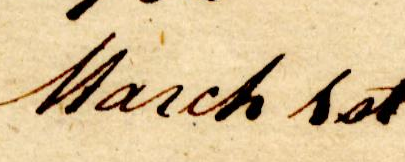March 1st
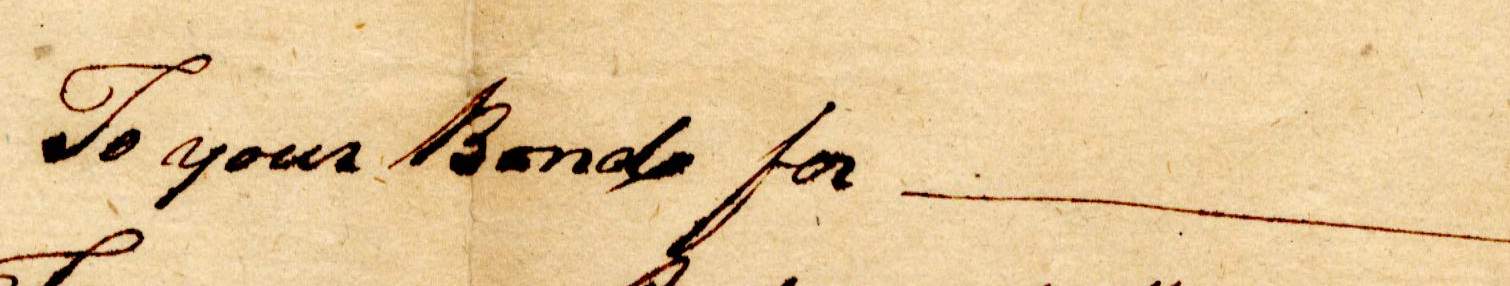To your Bonds for-
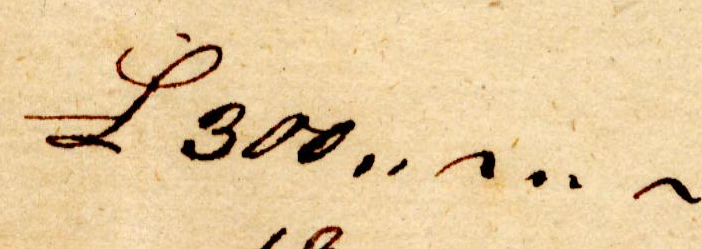£300..-..-
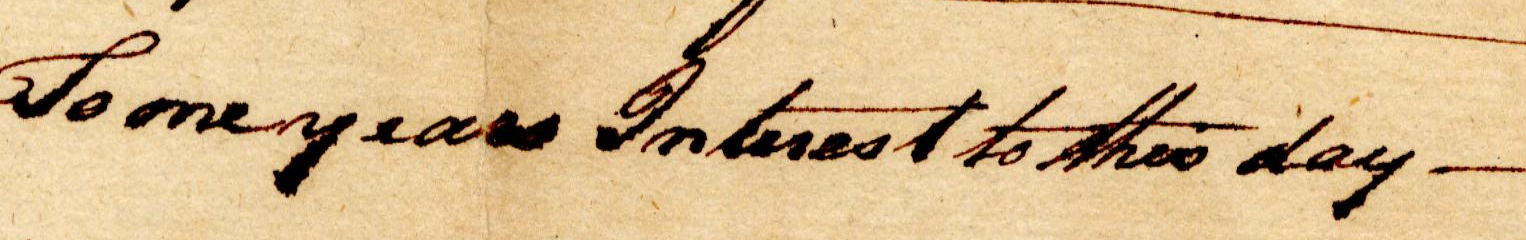Some years Interest to this day-
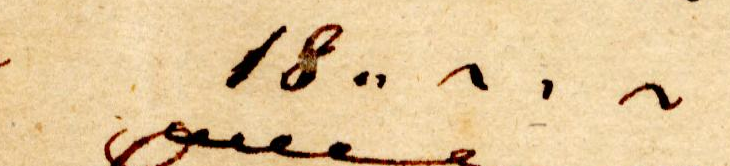18..-..-
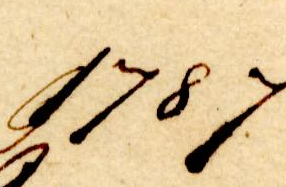1787
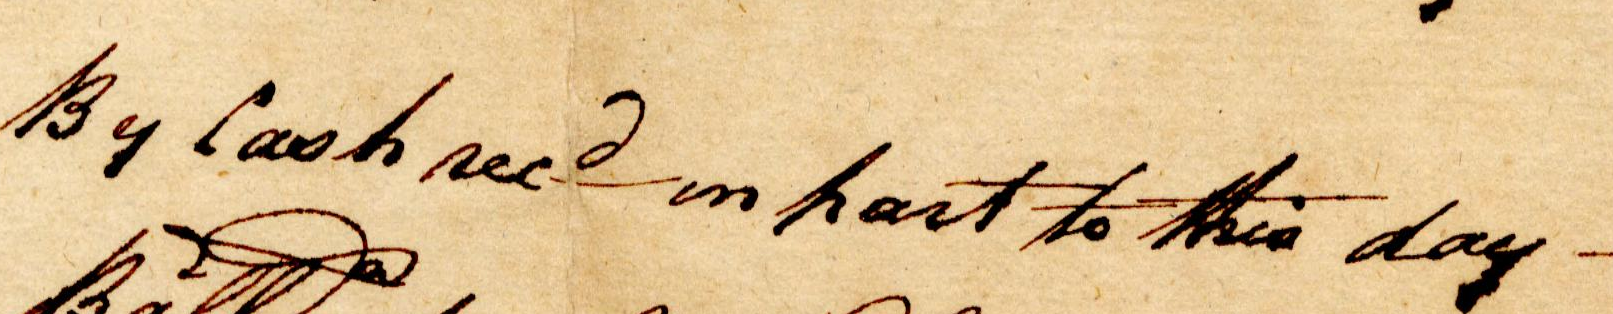By cash rec^d in part to this day
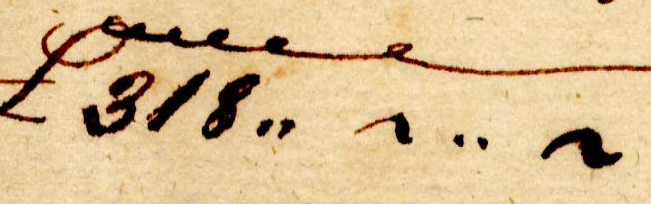£318..-..-
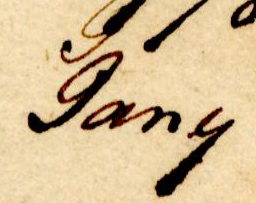Jany-
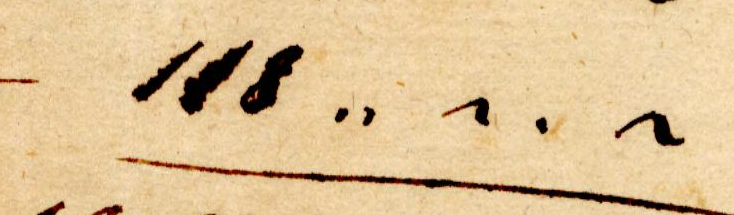118..-.-
